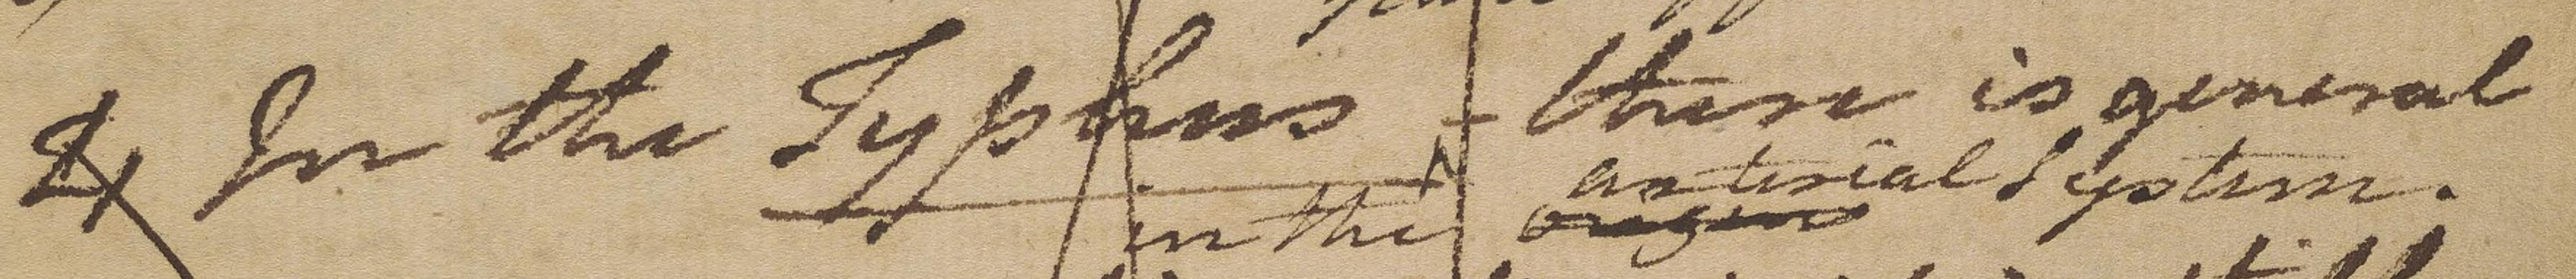4 In the Typhus ^ there is general
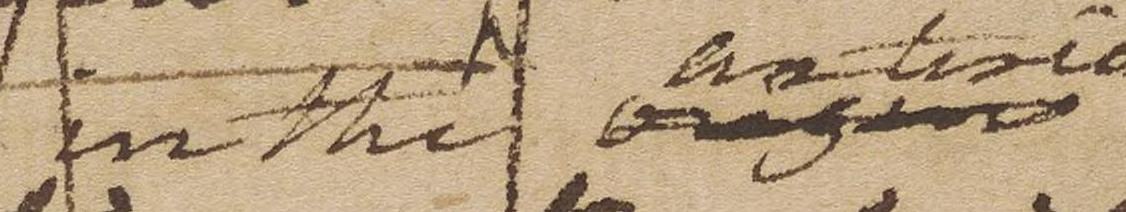in the [organ]
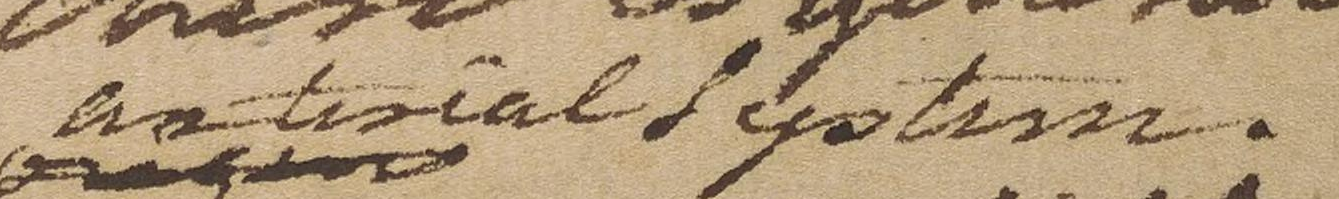arterial system
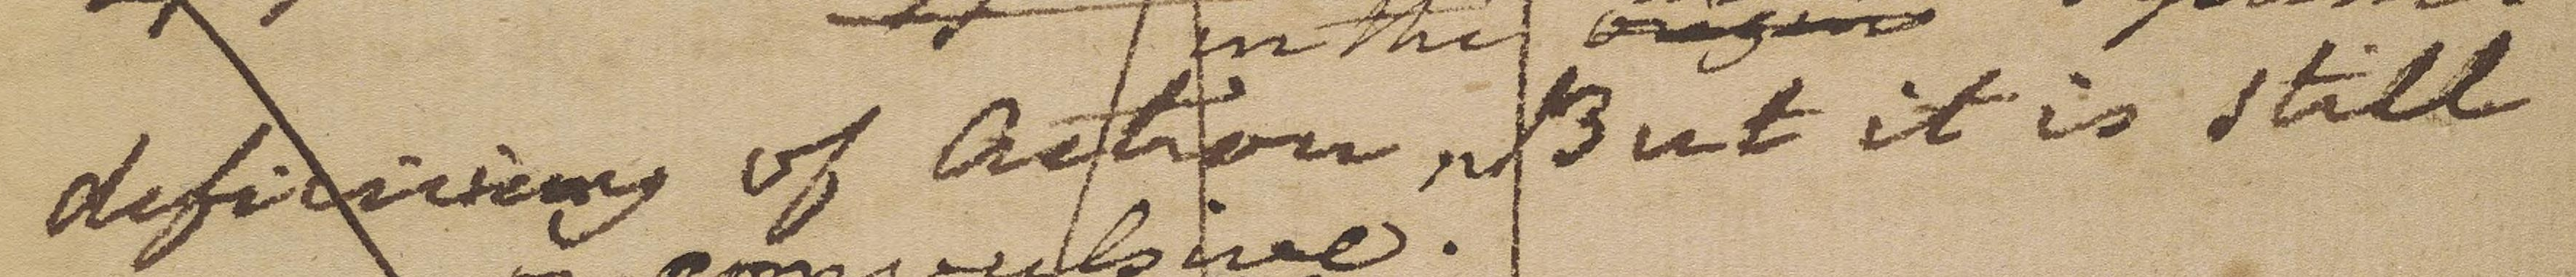deficiency of Action ^ But it is still
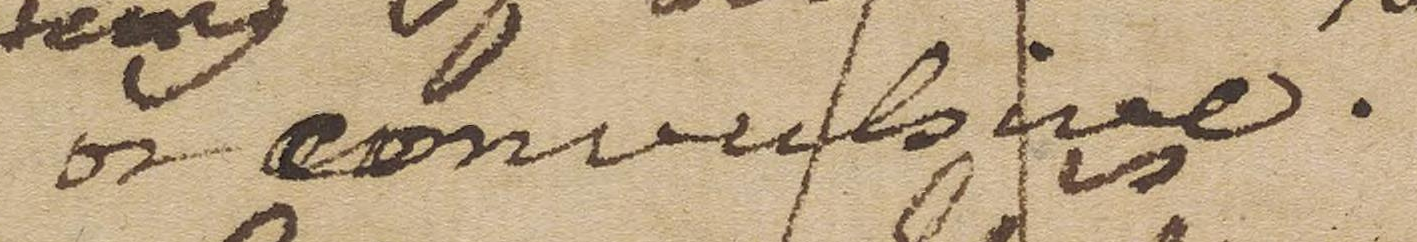or convulsive.
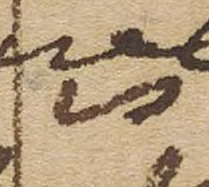is
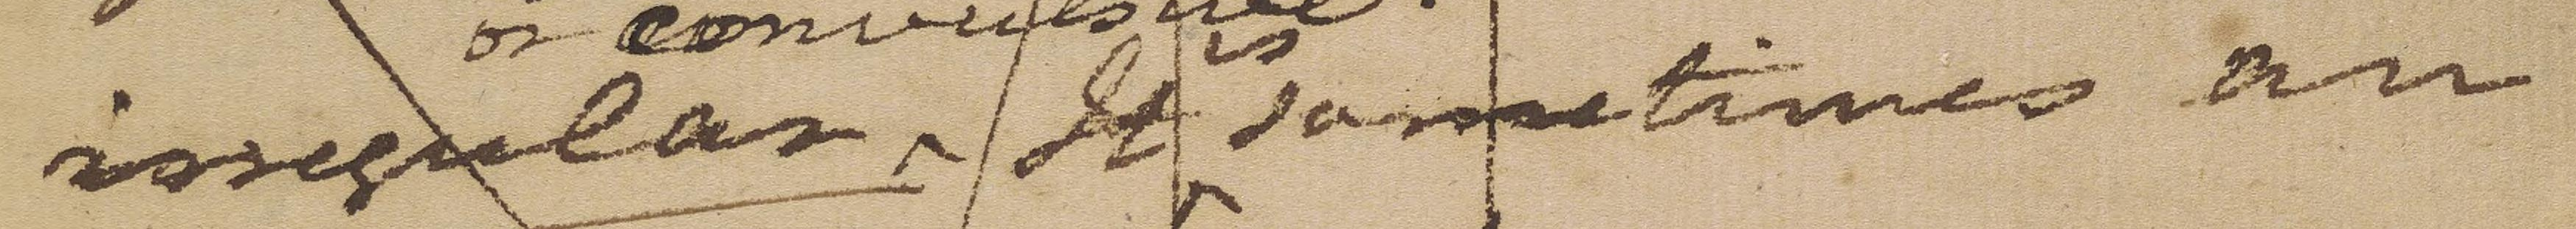irregular ^ It ^ sometimes an
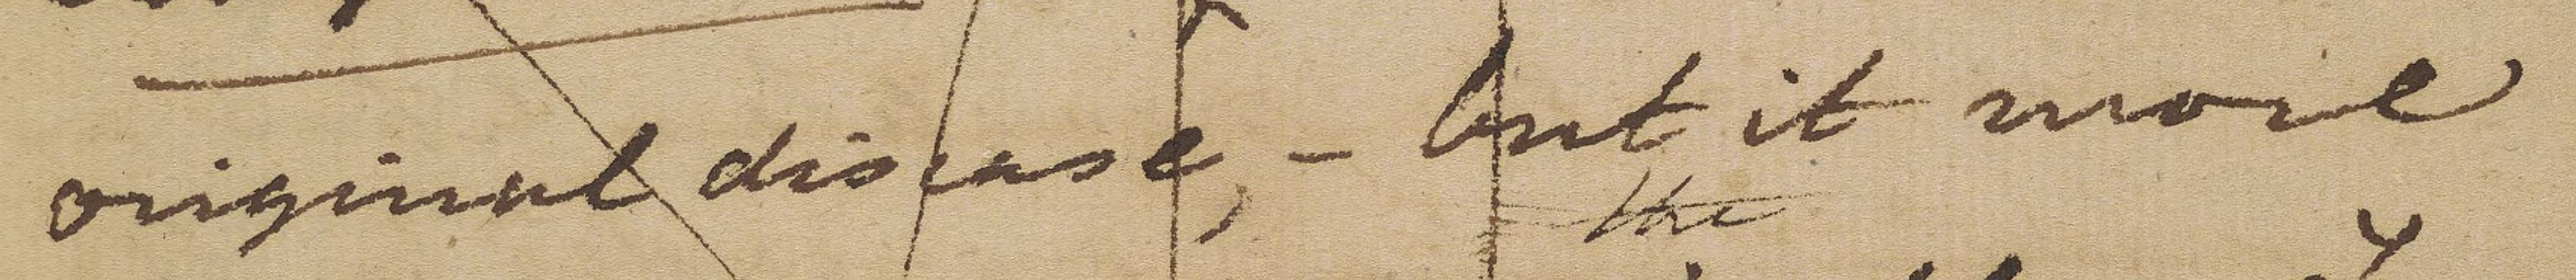original disease, but it more
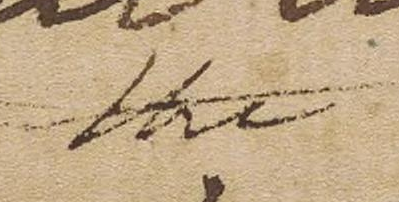the
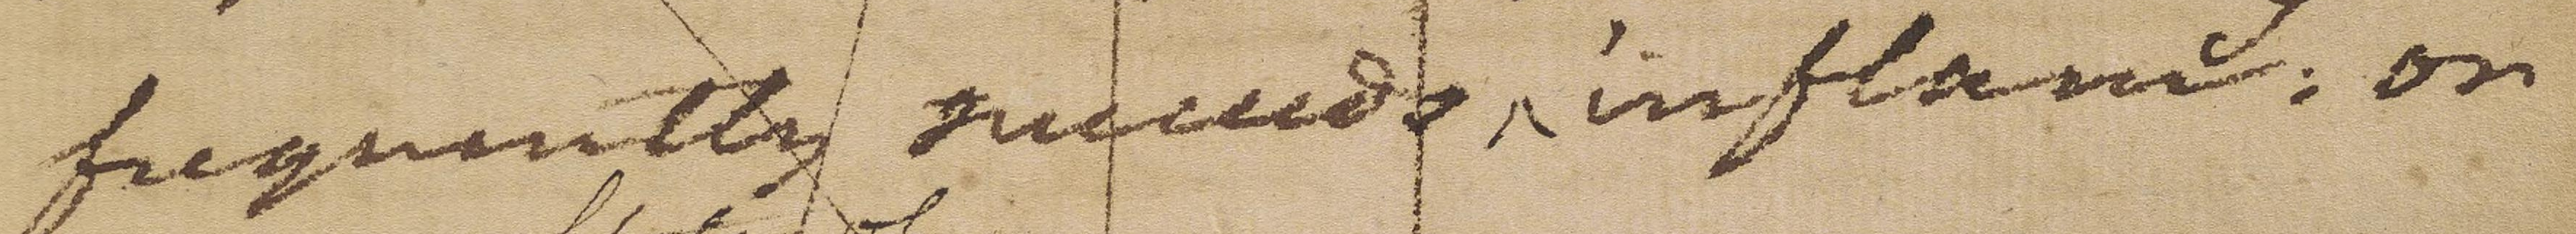frequently succeeds ^ inflam^y or
